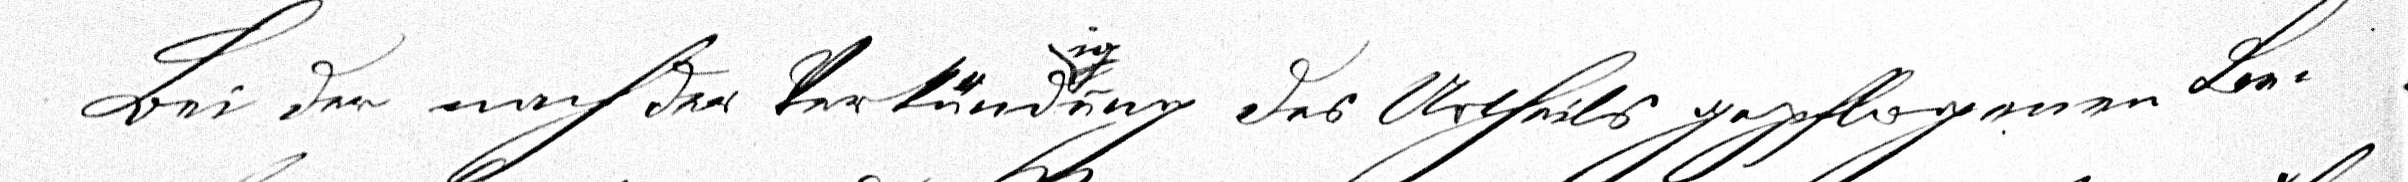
Bei der nach der Verkündigung des Urtheils gepflogenen Be¬
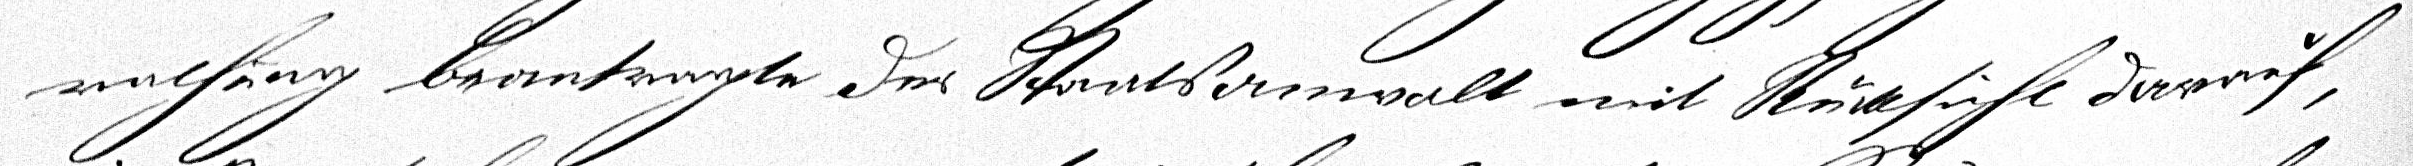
rathung beantragte der Staatsanwalt mit Rucksicht darauf,
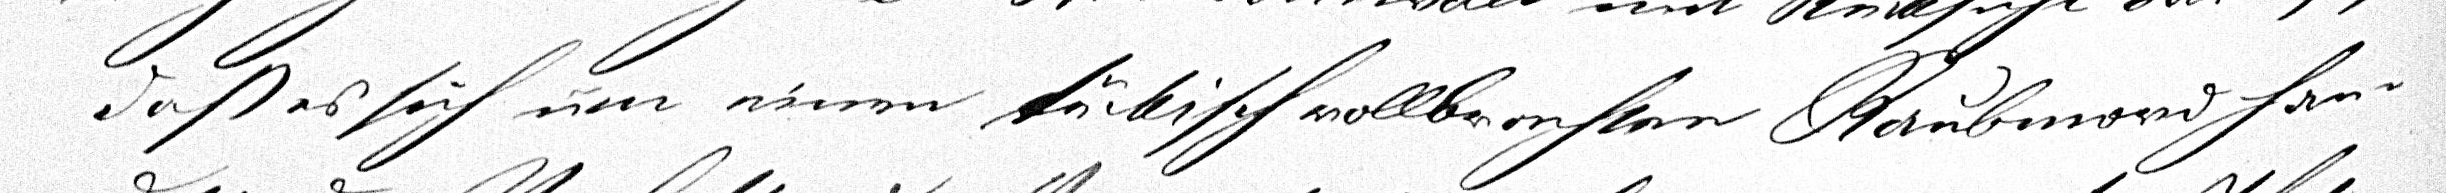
daß es sich um einen tückisch vollbrachten Raubmord han¬
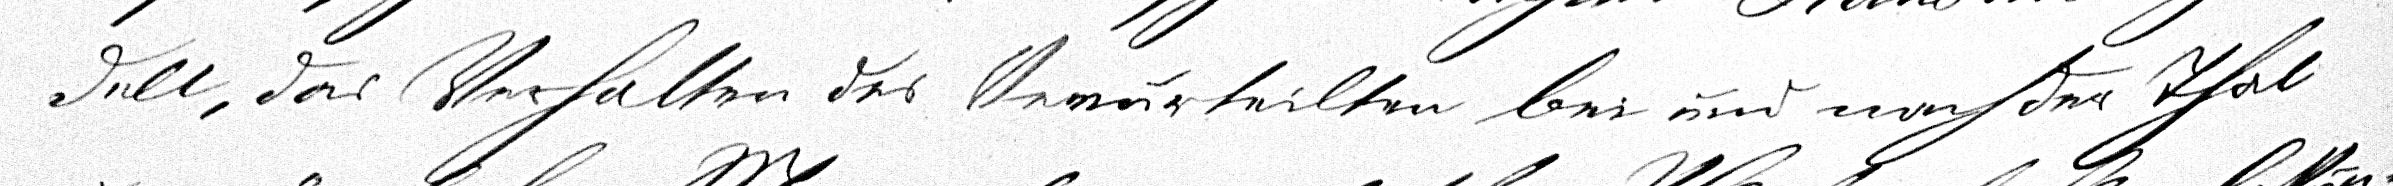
delt, das Verhalten des Verurteilten bei und noch der Thal
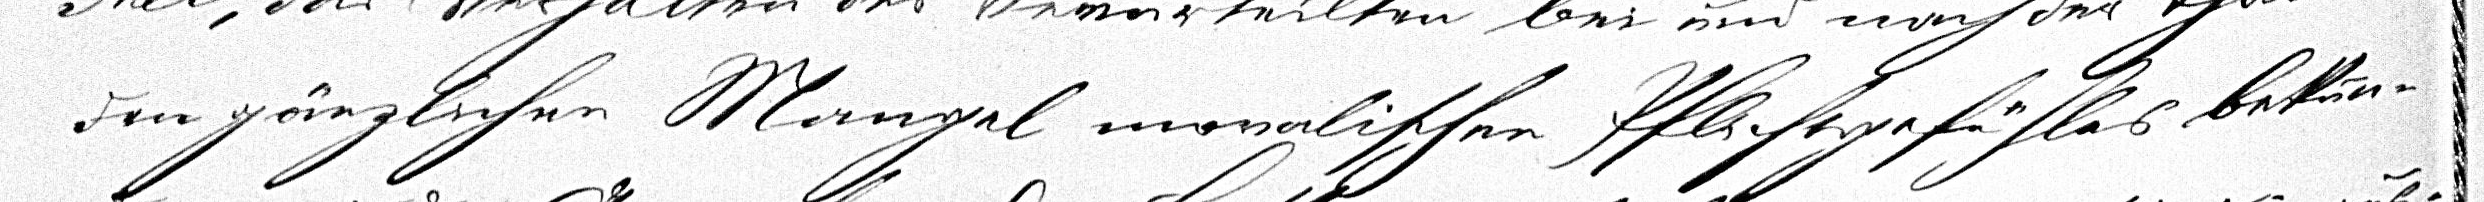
den gänzlichen Mangel moralischen Pflichtgefühls bekun¬
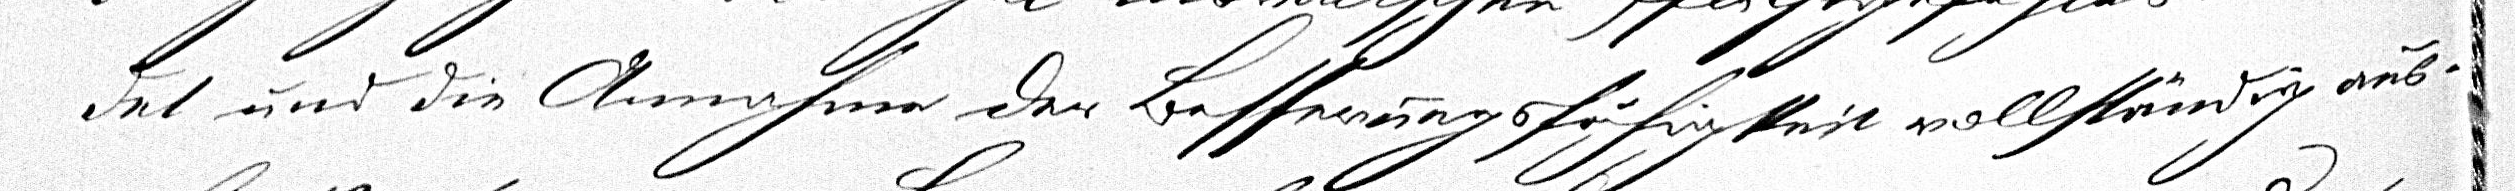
det und die Annahme der Besserungsführigkeit vollständig aus¬
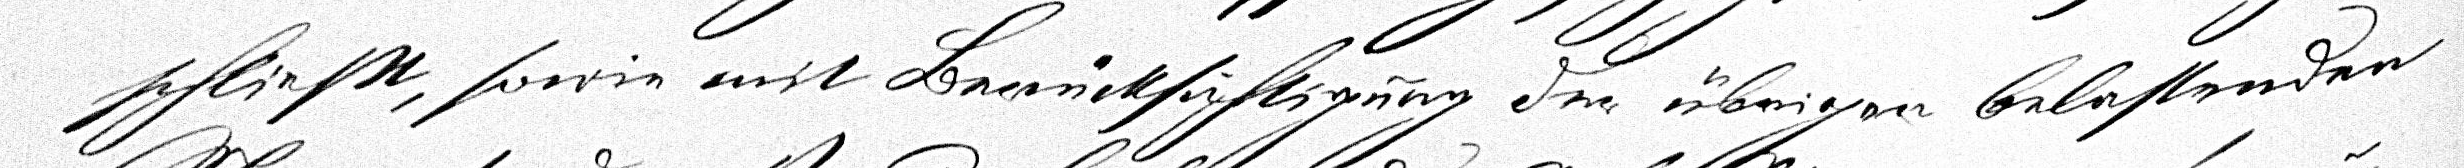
schließt, sowie mit Berücksichtigung der übrigen belastenden
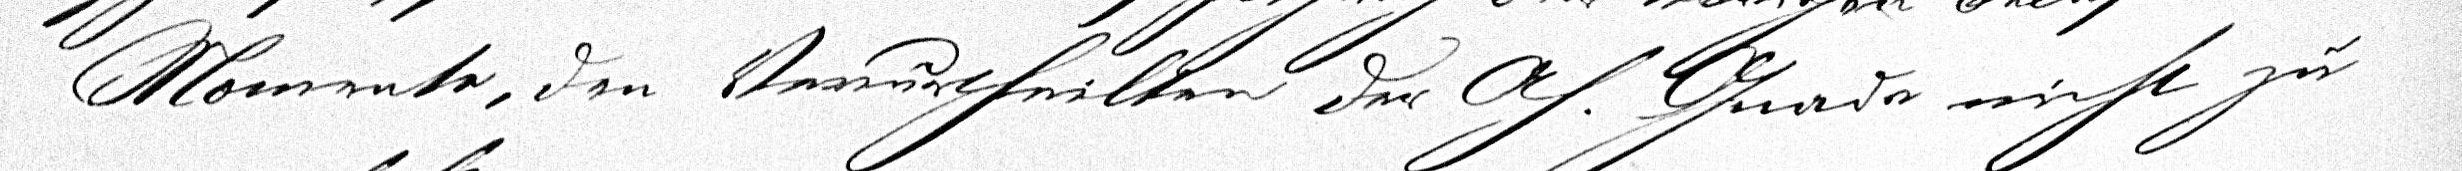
Momente, den Verurtheilten der Af. Gnade nicht zu
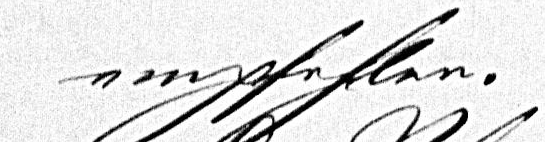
empfehlen.
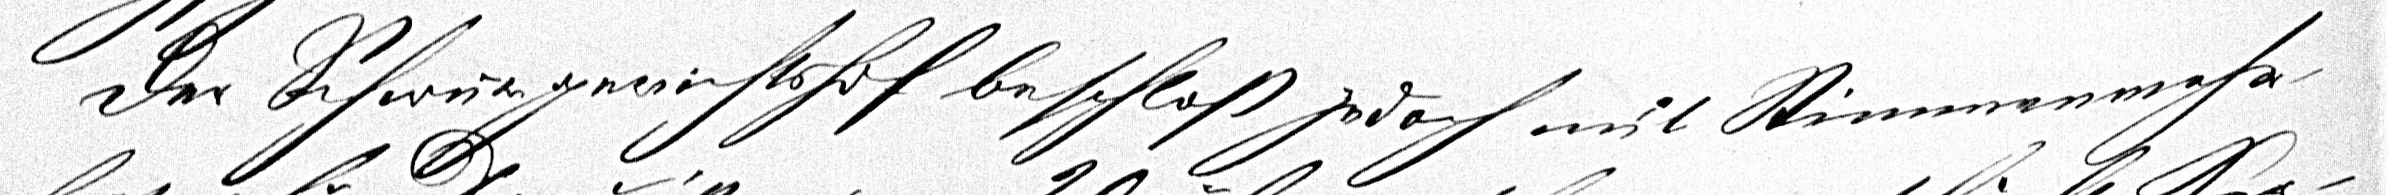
Der Schwurgerichtshof beschloß jedoch mit Stimmenmehr¬
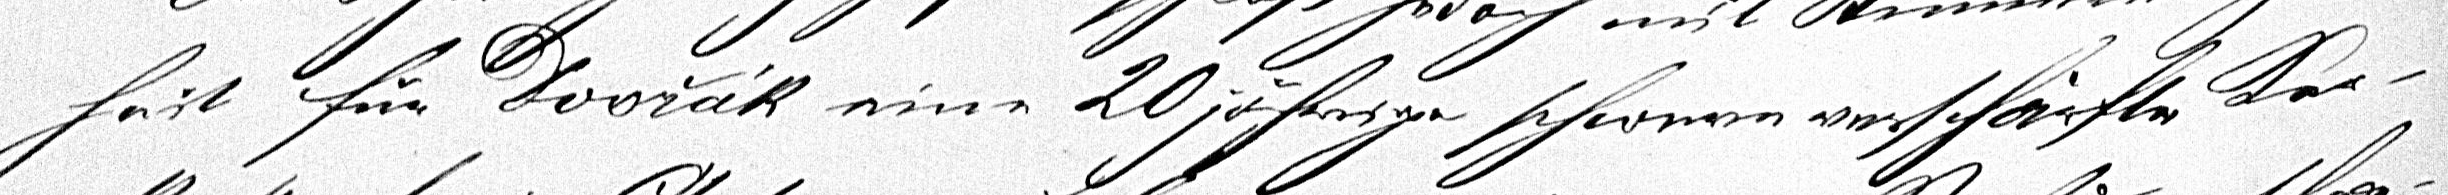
heit für Dvořák eine 20jährige schwere verschärfte Ker¬
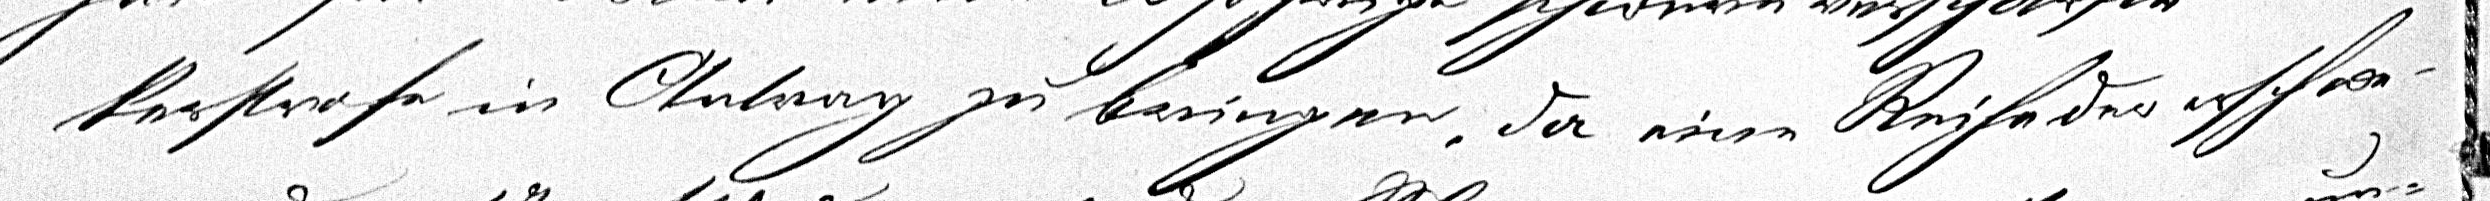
kerstrafe in Antrag zu bringen, da eine Reihe der erschwe¬
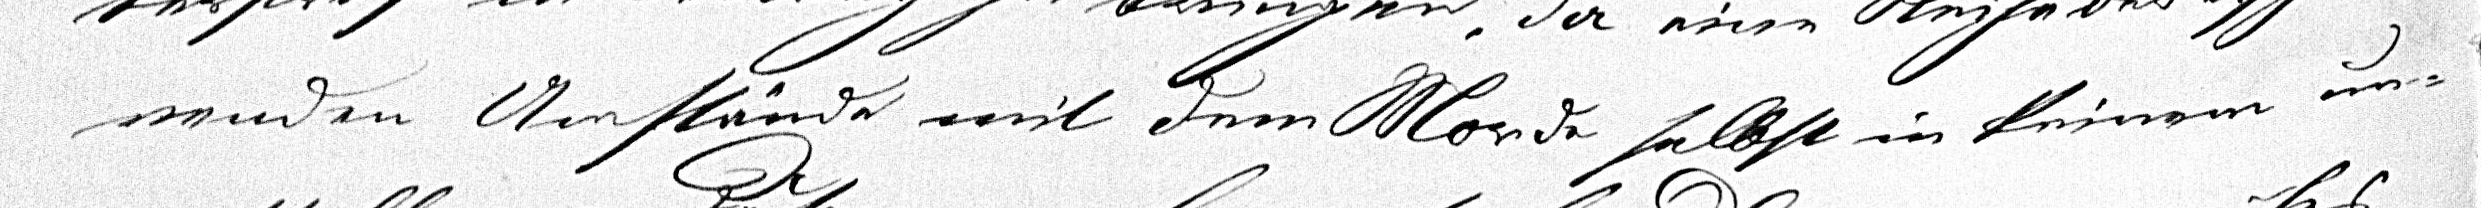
renden Urstände mit dem Morde selbst in keinen un¬
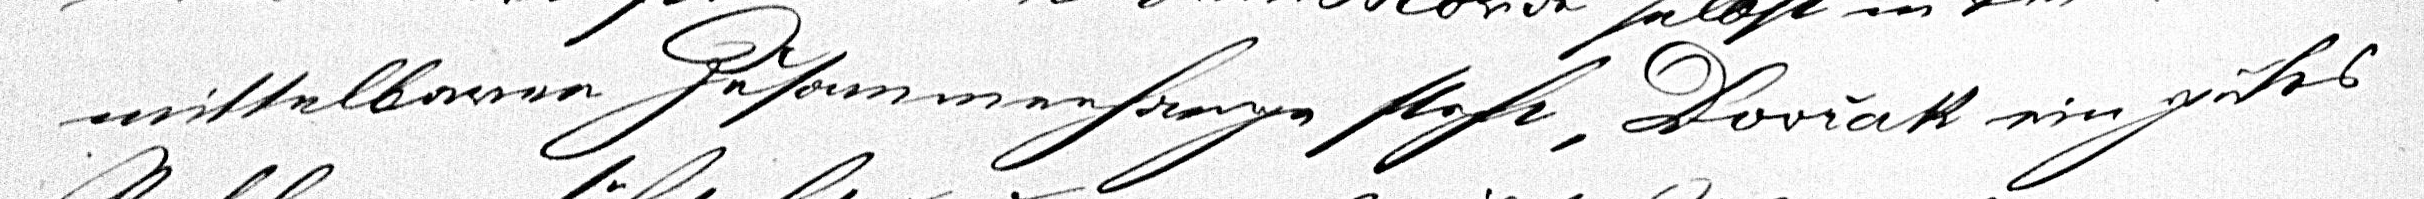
mittelbaren Zusammenhange steht, Dvořak ein gutes
